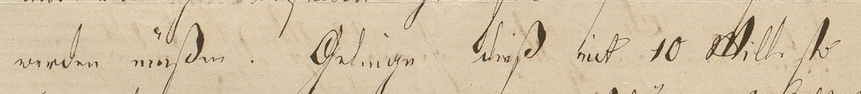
werden müßen. Gelinge dieß mit 10 Mill. so
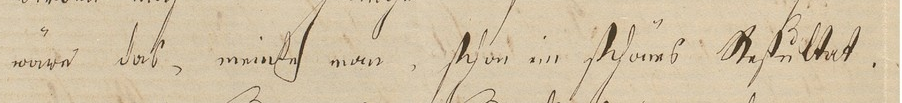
wäre das, meinte man, schon ein schönes Resultat.
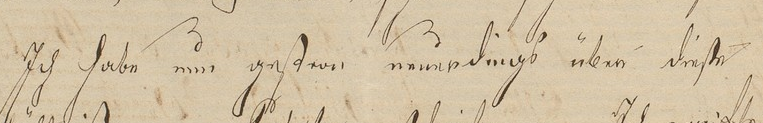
Ich habe nun gestern neuerdings über diese
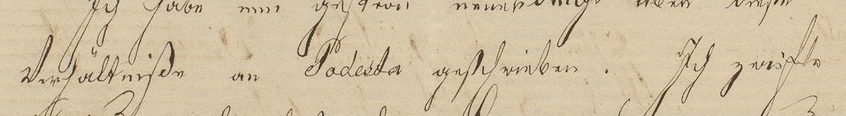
Verhältniße an Podesta geschrieben. Ich zweifle
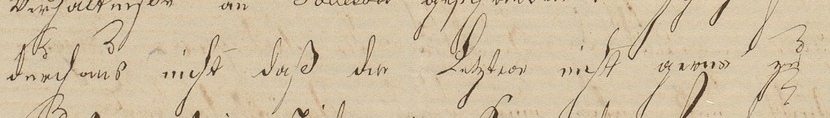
durchaus nicht daß der Letztrer nicht gerne zu
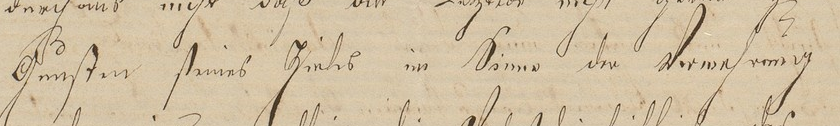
Gunsten seines Zieles im Sinne der Vermehrung
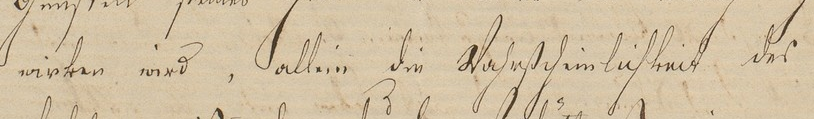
wirken wird, allein die Wahrscheinlichkeit des
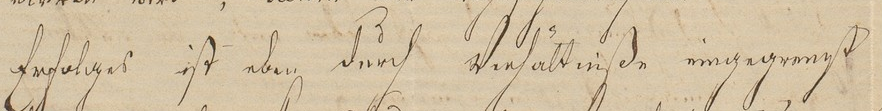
Erfolges ist eben durch Verhältniße eingegrenzt
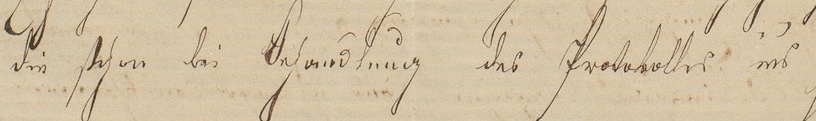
die schon bei Behandlung des Protokolles ins
